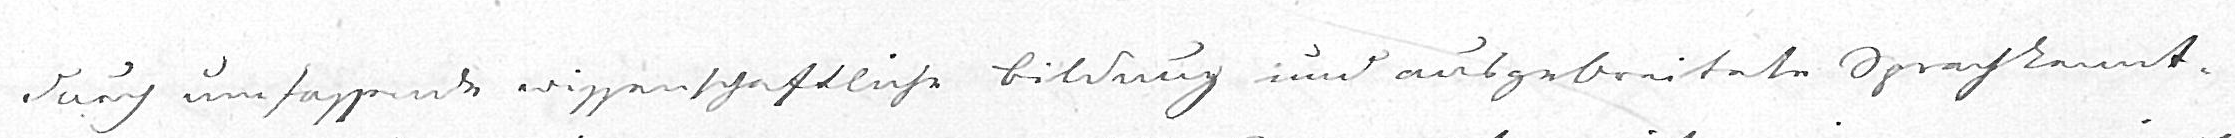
durch umfassende wissenschaftliche Bildung und ausgearbeitete Sprachkennt-
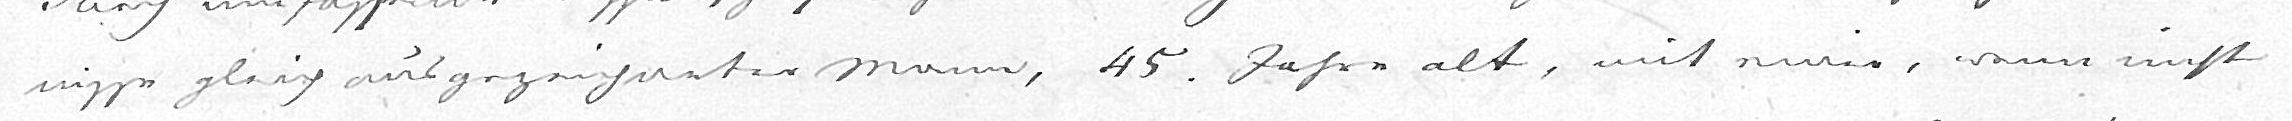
nisse gleich ausgezeichneter Mann, 45. Jahre alt, mit einer, wenn nicht
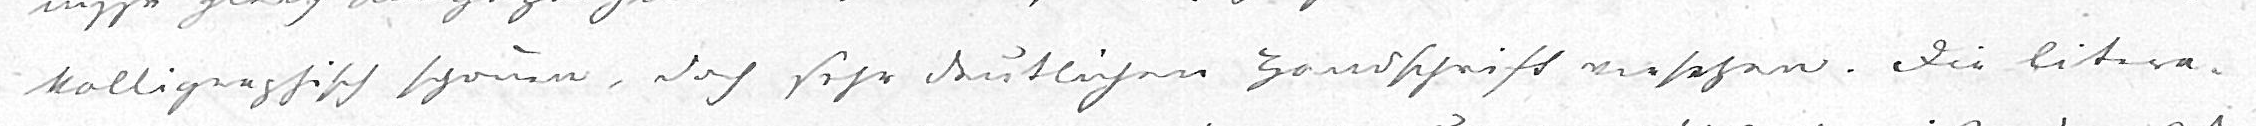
kalligraphisch schönen, doch sehr deutlichen Handschrift versehen. Die litera-
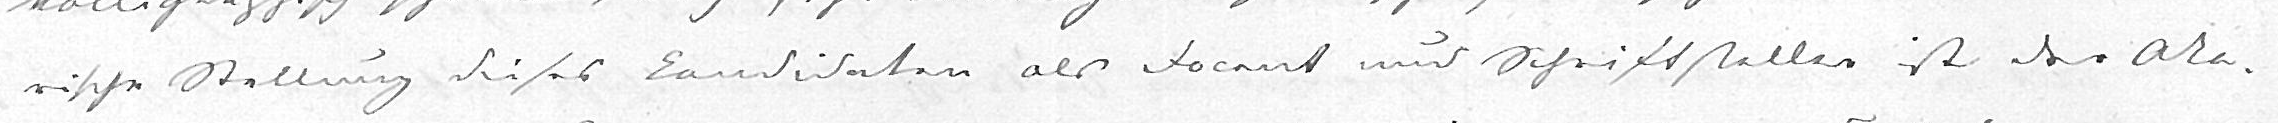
rische Stellung dieses Candidaten als Docent und Schriftsteller ist der Aka-
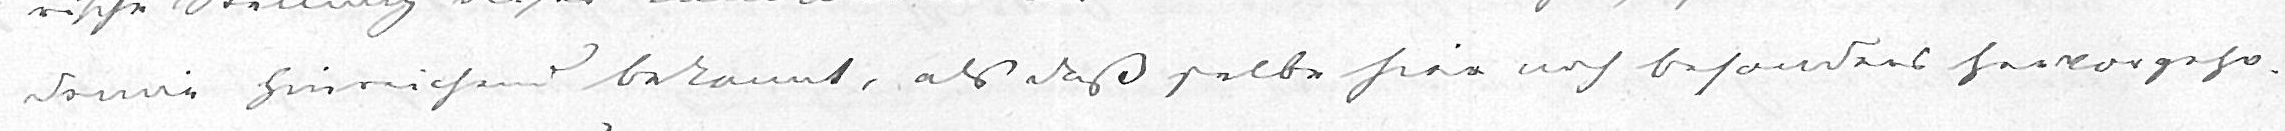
demie hinreichend bekannt, als daß selbe hier noch besonders hervorgeho
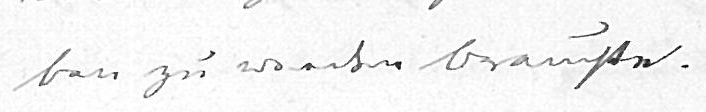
ben werden brauchte.
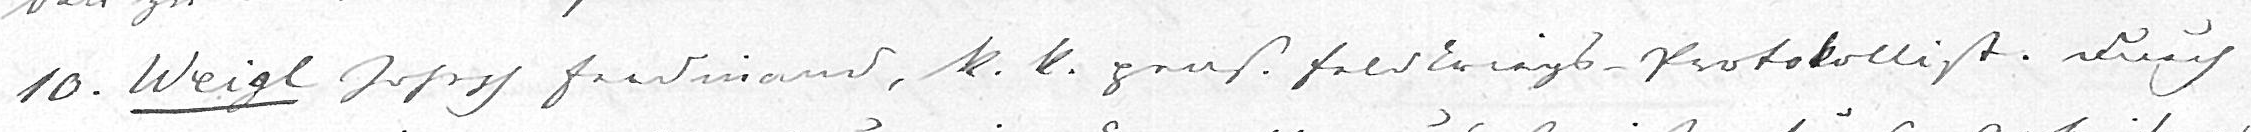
10. Weigl Joseph Ferdinand, k.k. pens. Feldkriegs-Protokollist. Durch
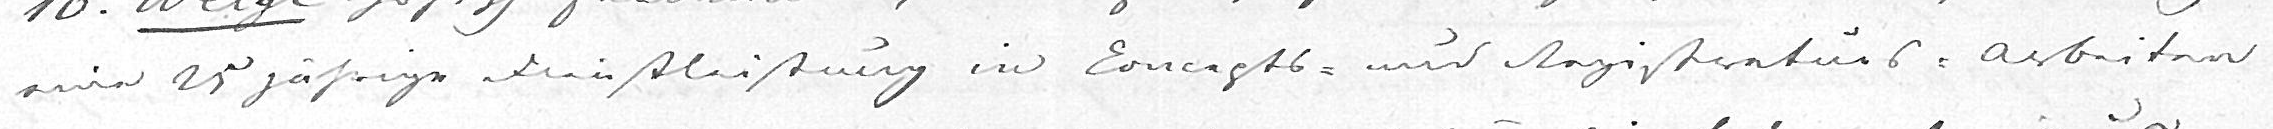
eine 25jährige Dienstleistung in Concecpts- und Registraturs-Arbeiten
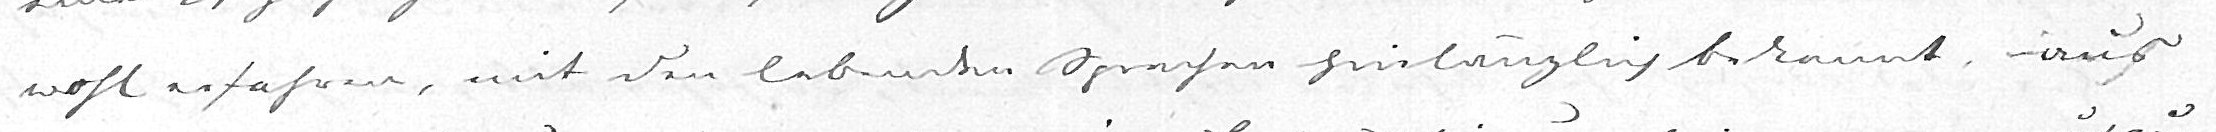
wohl erfahren, mit den lebenden Sprachen hinlänglich bekannt. Aus
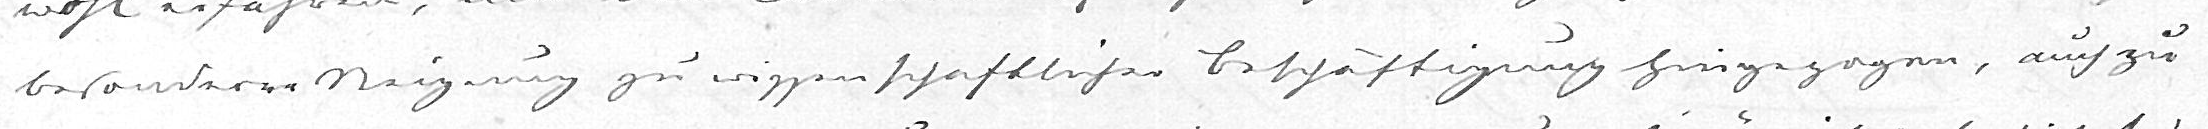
besonderer Neidung zu wissenschaftlicher Beschäftigung hingezogen, auch zu
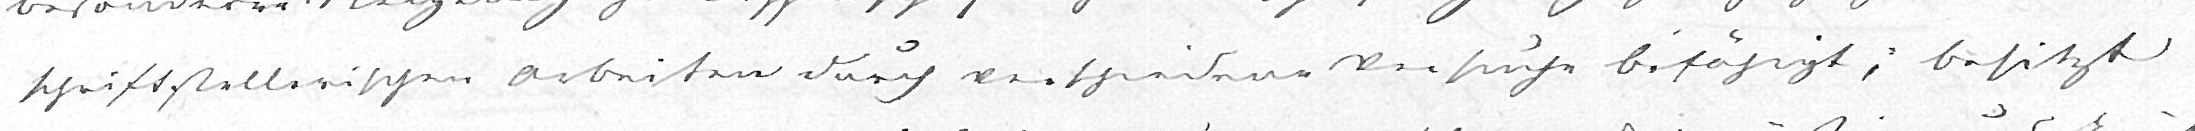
schriftstellerischen Arbeiten durch verschiedene Versuche befähigt, besitzt
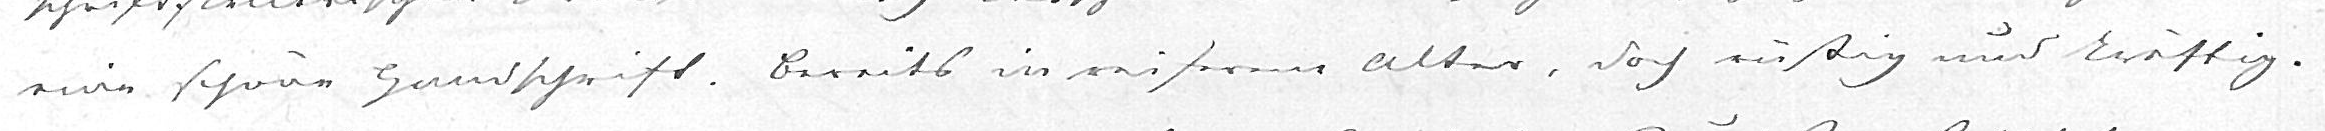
eine schöne Handschrift. Bereits in reiferem Alter, doch rüstig und kräftig.
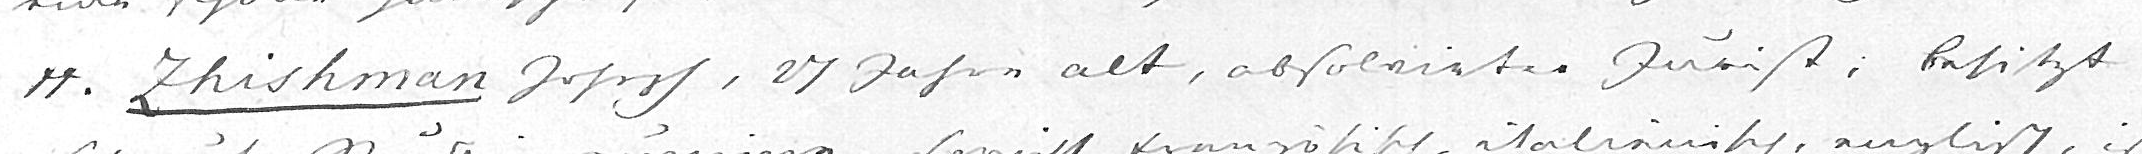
11. Zhishman Joseph, 27 Jahre alt, absolvirter Jurist, besitzt
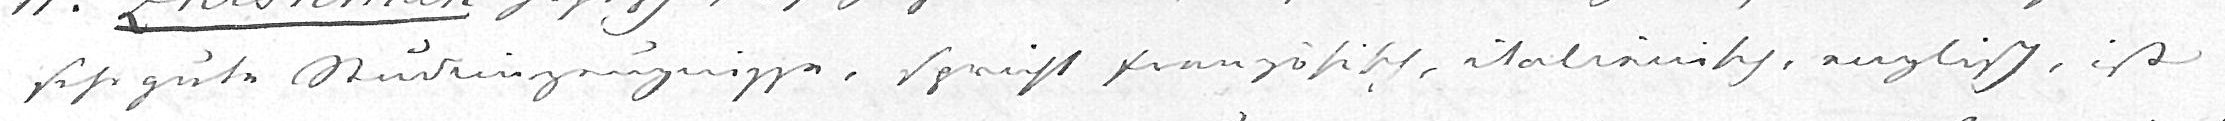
sehr gute Studienzeugnisse, spricht französisch, italienisch, englisch, ist
